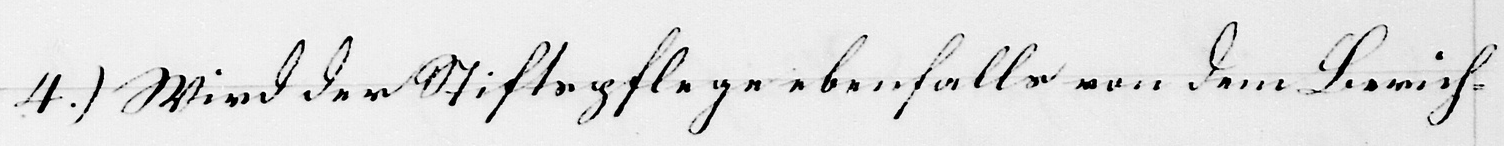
4.) Wird der Stiftspflege ebenfalls von dem Berich¬
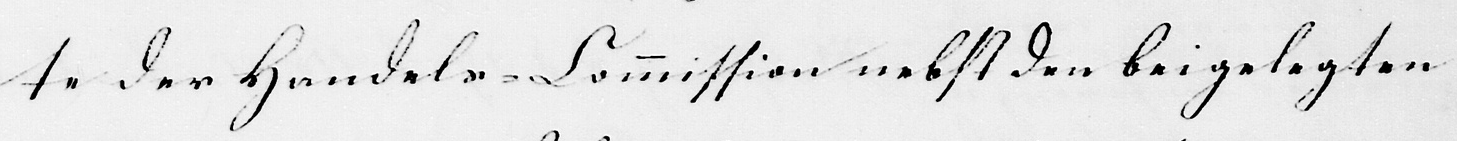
te der Handels-Commission nebst den beigelegten
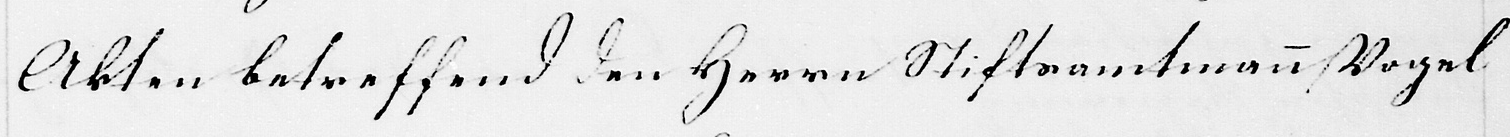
Akten betreffend den Herrn Stiftsamtmann Vogel
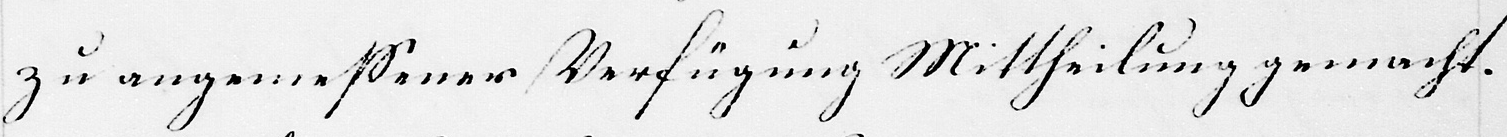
zu angemeßener Verfügung Mittheilung gemacht.
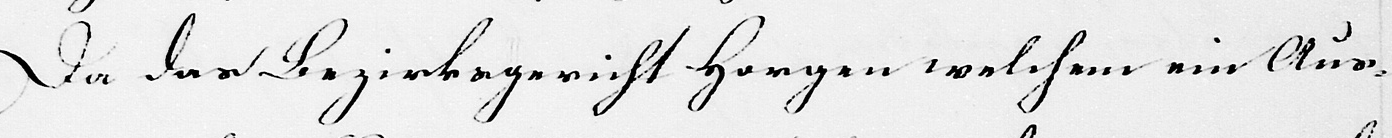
Da das Bezirksgericht Horgen welchem ein Aus¬
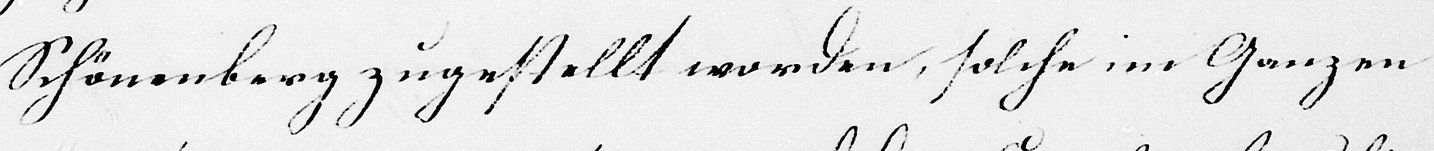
Schönenberg zugestellt worden, solche im Ganzen
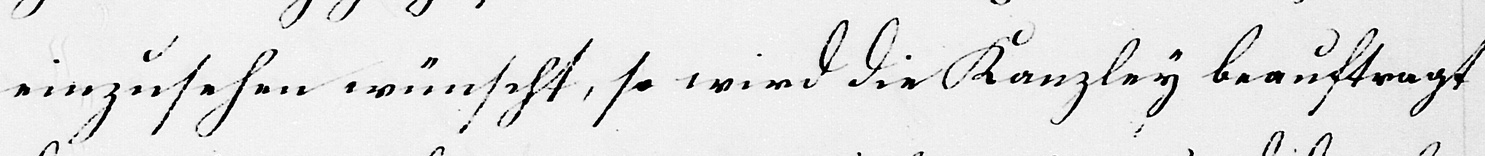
einzusehen wünscht, so wird die Kanzley beauftragt
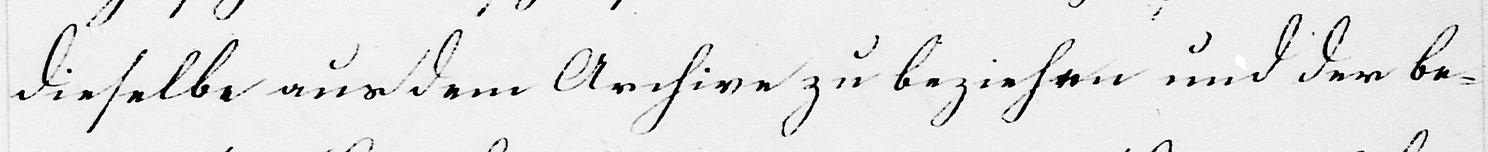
dieselbe aus dem Archive zu beziehen und der be¬
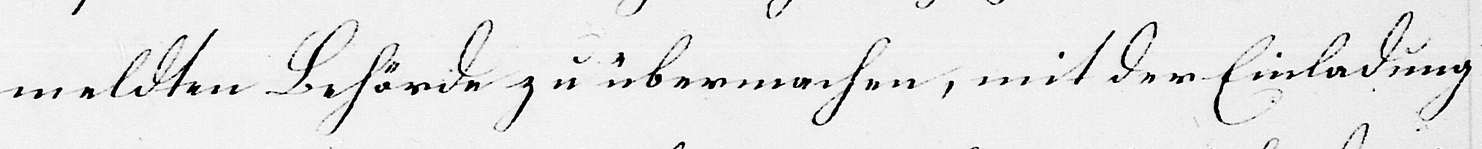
meldten Behörde zu übermachen, mit der Einladung
